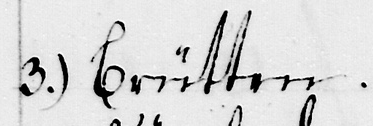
3.) Brütten
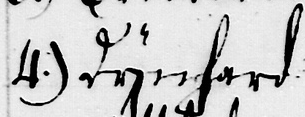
4.) Dynhard
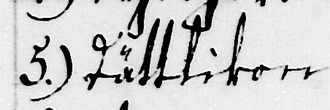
5.) Dättlikon
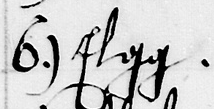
6.) Elgg
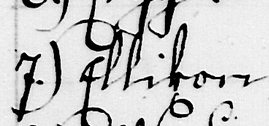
7.) Ellikon
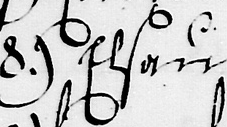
8.) Elsau
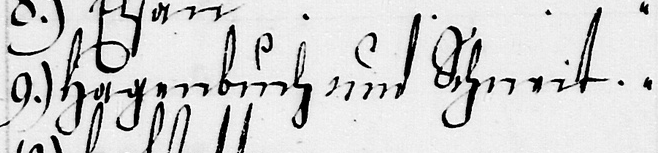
9.) Hagenbuch und Schneit
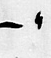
8.
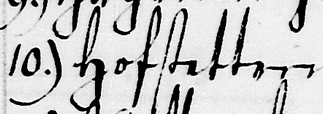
10.) Hofstetten
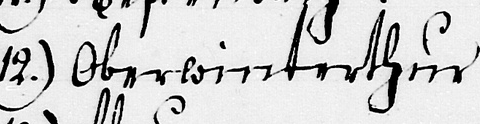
12.) Oberwinterthur
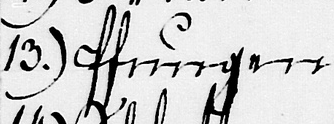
13.) Pfungen
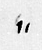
11.
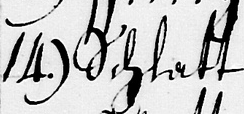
14.) Schlatt
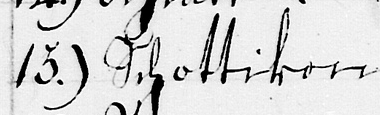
15.) Schottikon
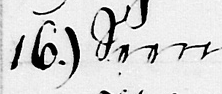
16.) Seen
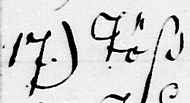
17.) Töß
